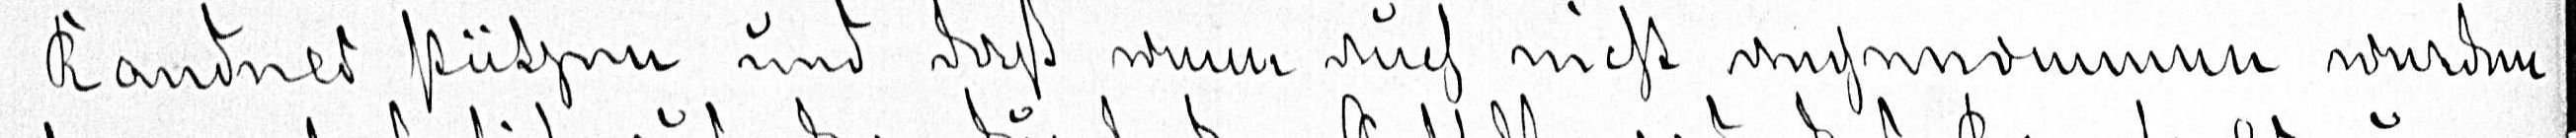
Raudner stützen und daß wenn auch nicht angenommen wurden
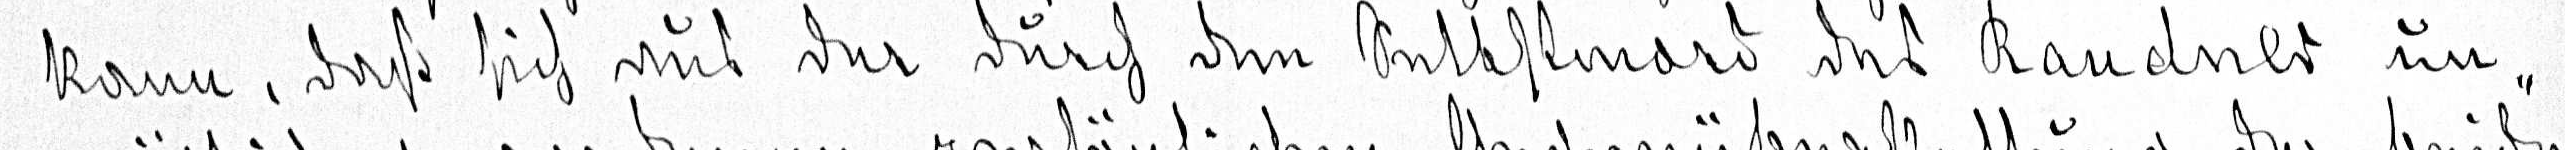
kann, daß sich aus der durch den Selbstmord des Raudner un¬
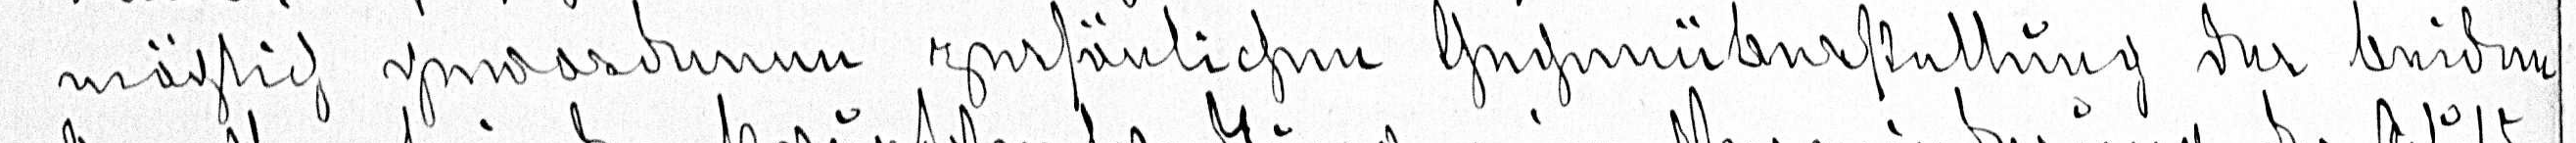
möglich gewordenen persönlichen Gegenüberstellung der beiden
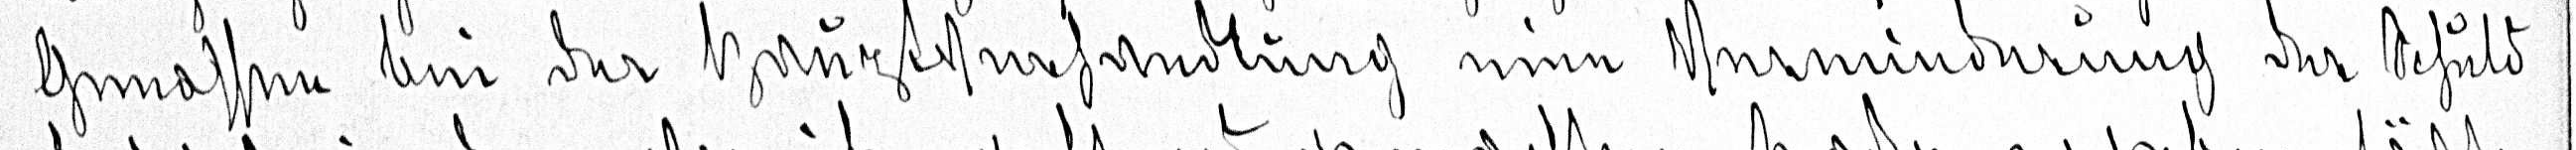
Genossen bei der Hauptverhandlung eine Verminderung der Schuld
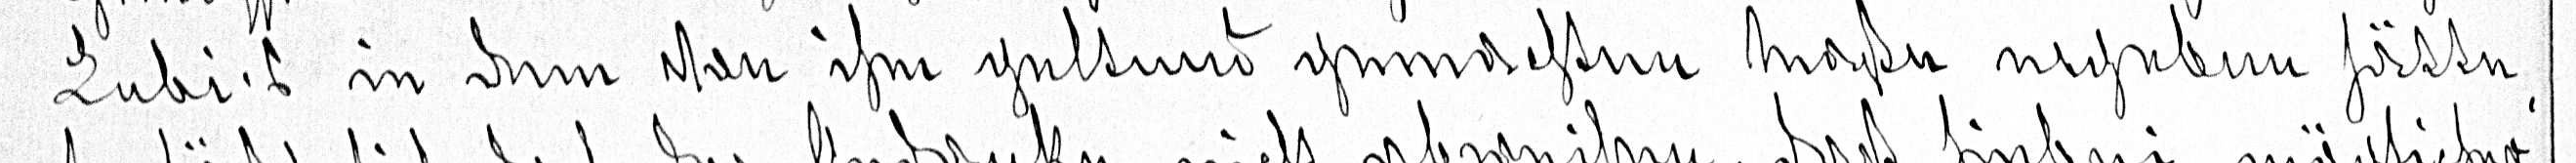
Lubi’s in dem von ihm geltend gemachten Maße ergeben hätte
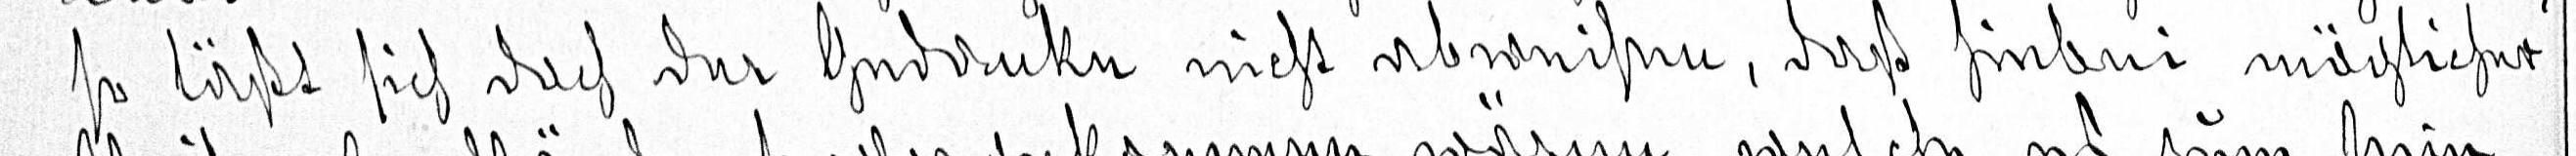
so läßt sich doch der Gedanke nicht abweichen, daß hiebei möglicher
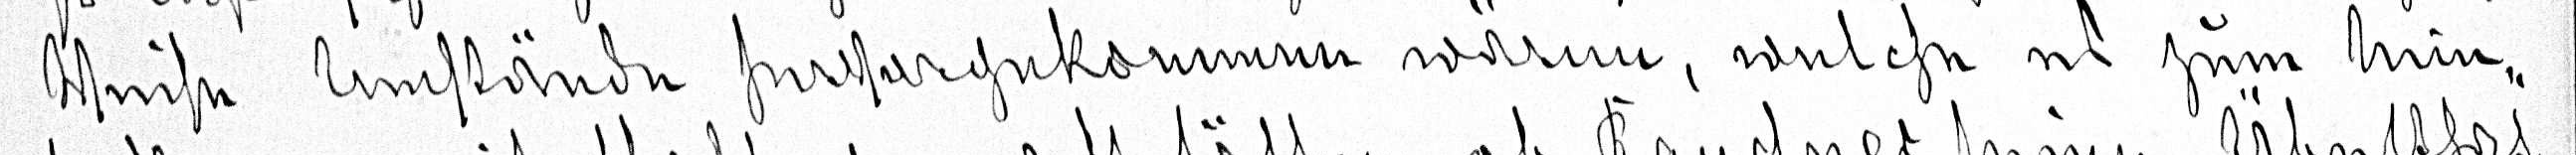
Weise Umstände hervorgekommen wären, welche es zum Min¬
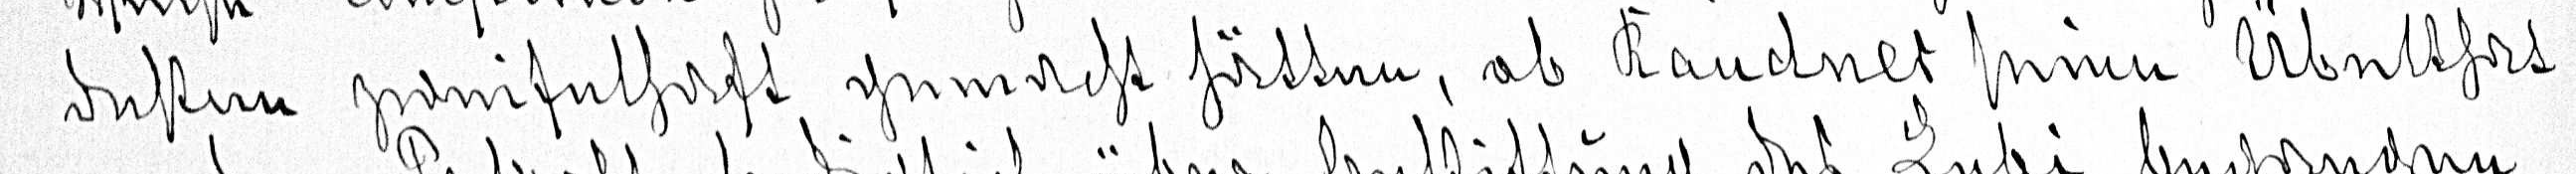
desten zweifelhaft gemacht hätten, ob Raudner seine Übelthat
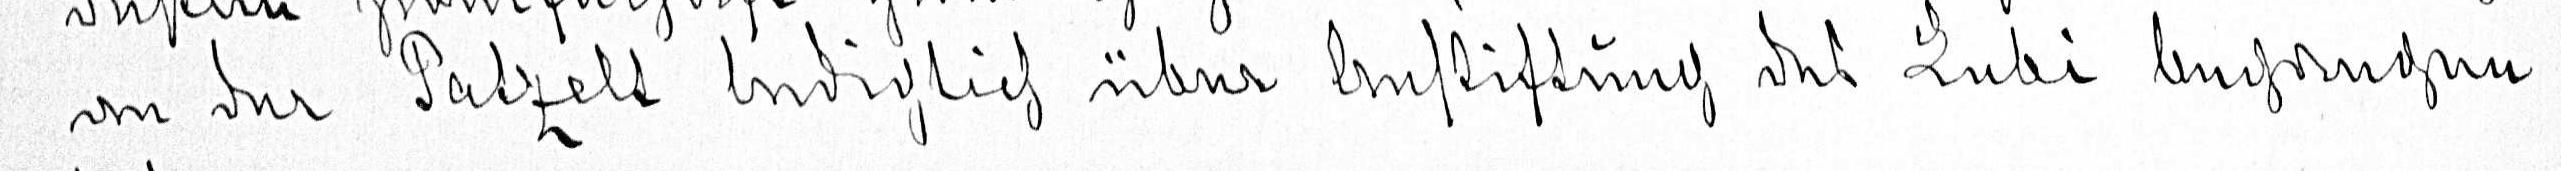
an der Patzelt lediglich über Anstiftung des Lubi begangen
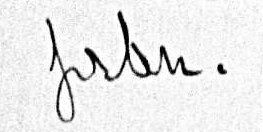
habe.
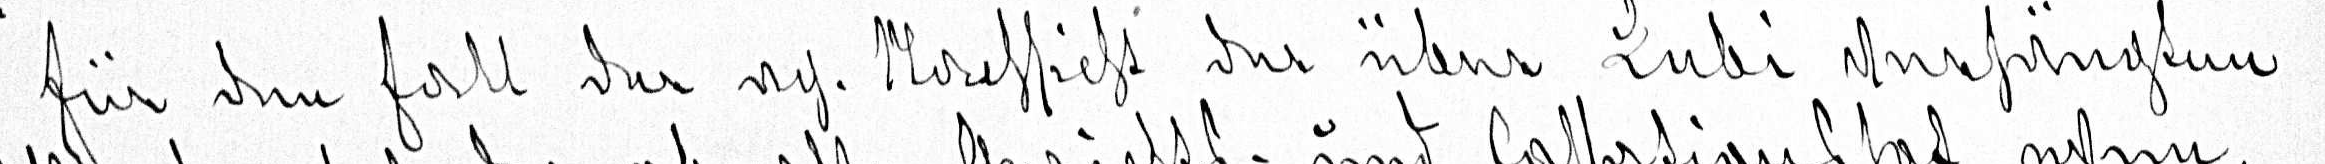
Für den Fall der ag. Nachsicht der über Lubi verhängten
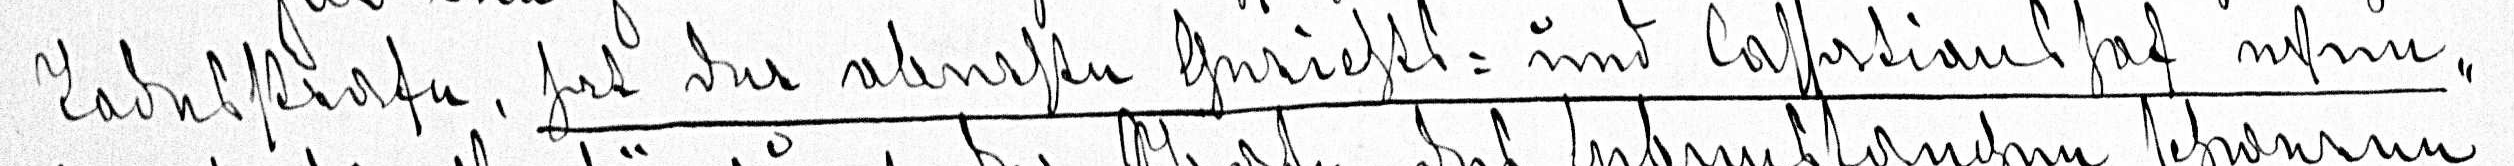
Todesstrafe, hat der oberste Gerichts- und Cassationshof even¬
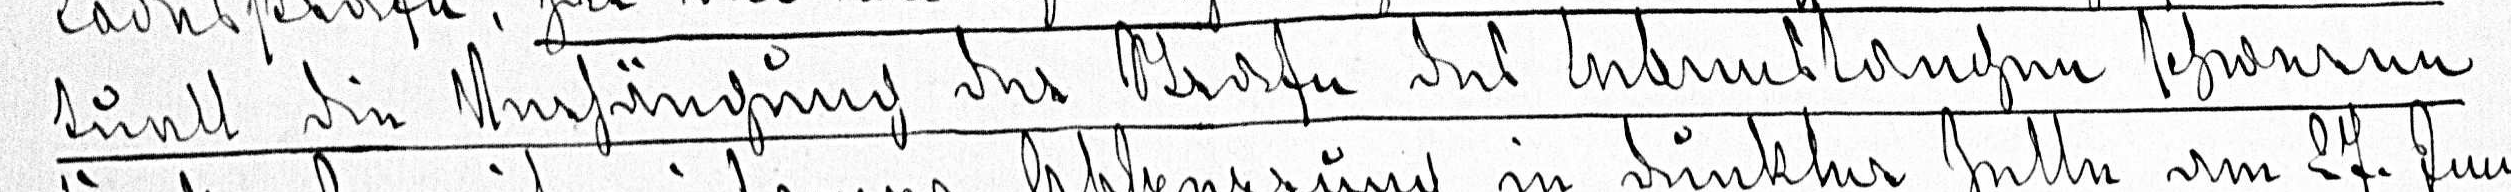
tuell die Verhängung der Strafen des lebenslangen schweren
